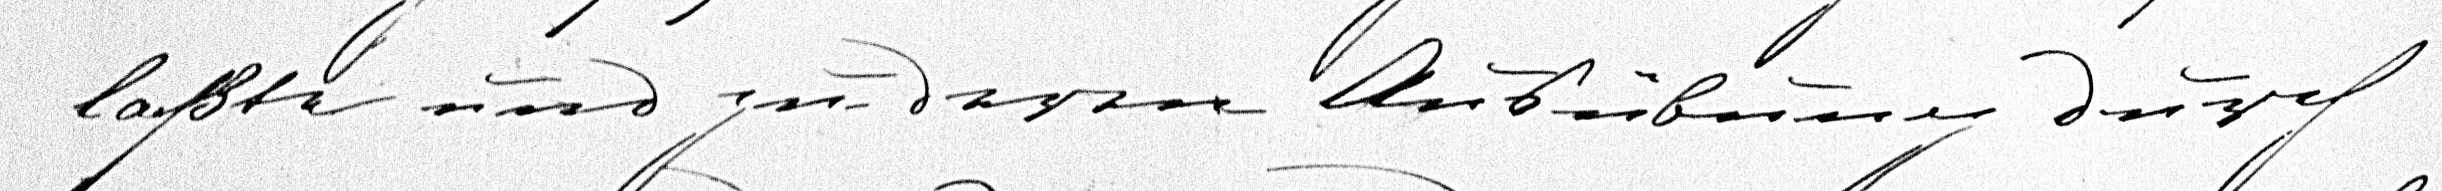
laßte und zu deren Ausübung durch
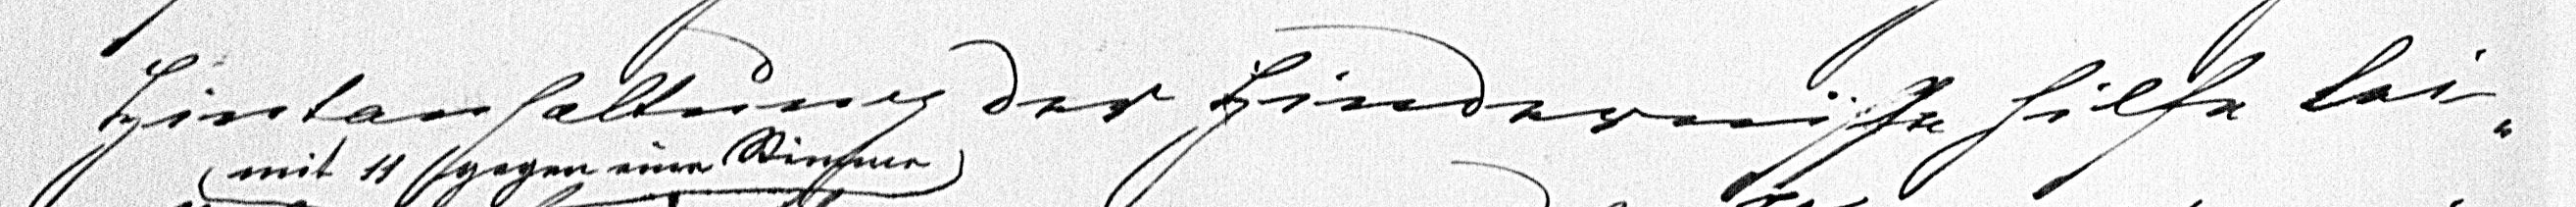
Hintanhaltung der Hindernisse Hilfe lei¬
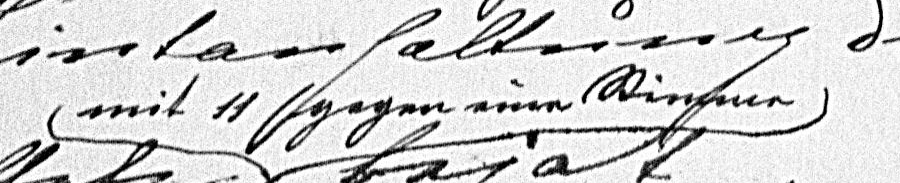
mit 11 gegen eine Stimme
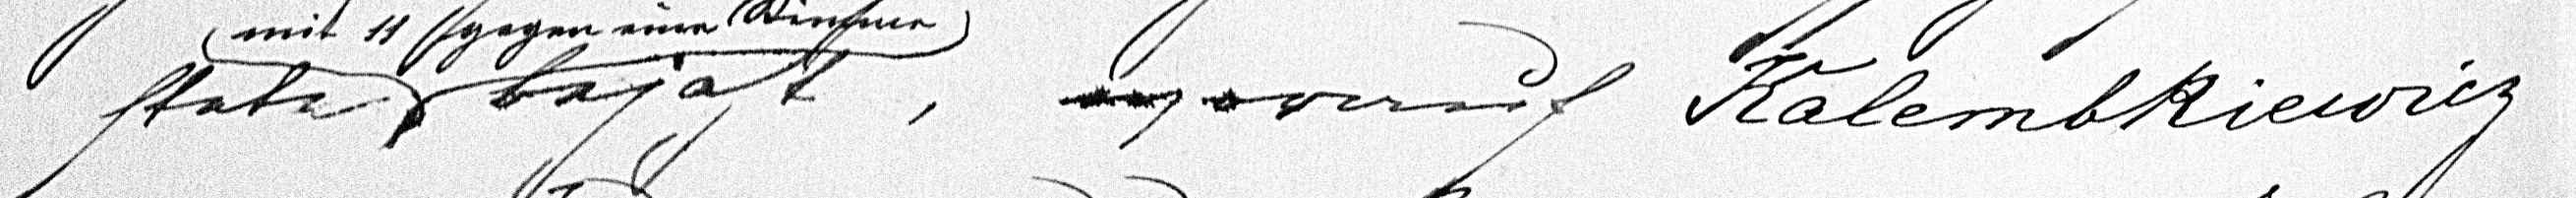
stete bejaht, worauf Kalembkiewicz
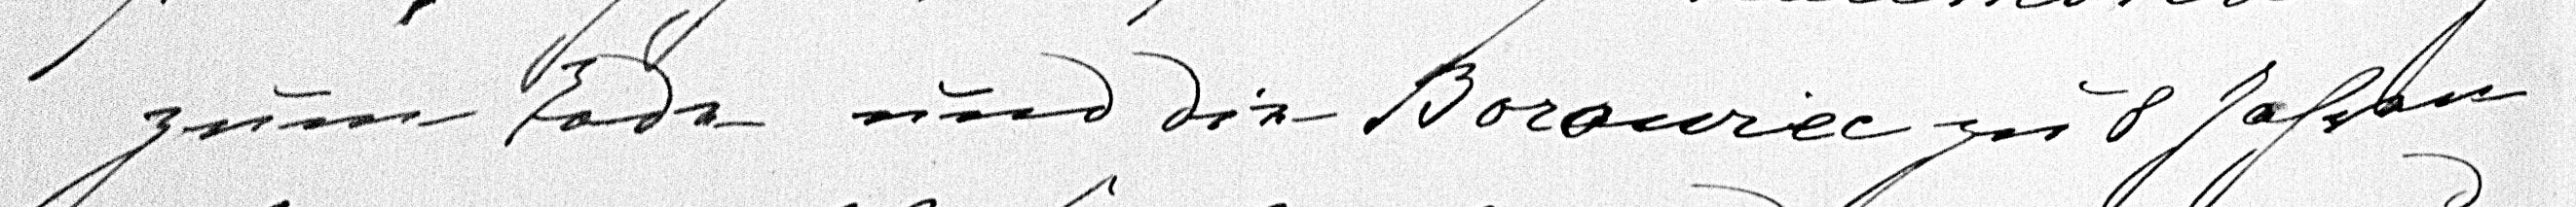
zum Tode und die Borowiec zu 8 Jahren
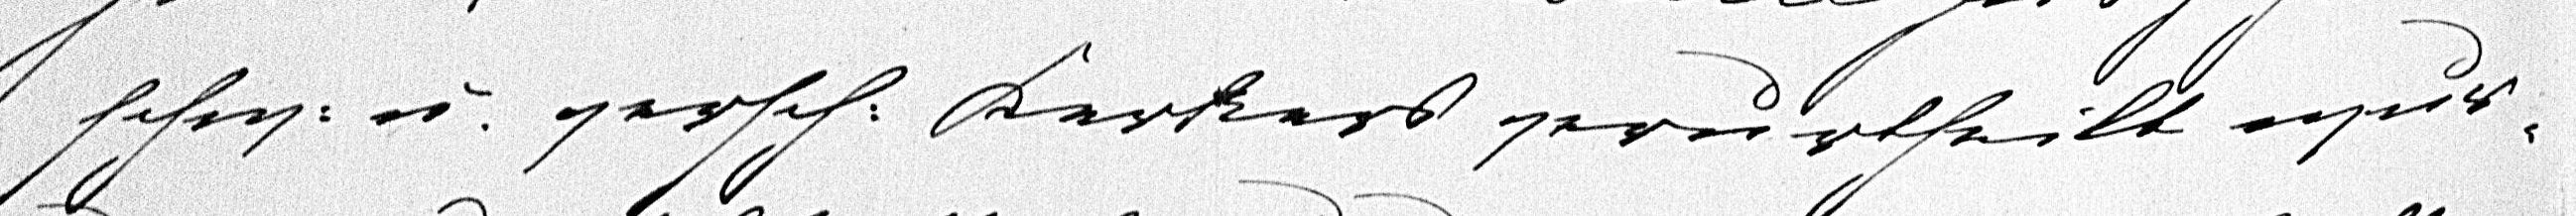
schw. u. versch. Kerkers verurtheilt wur¬
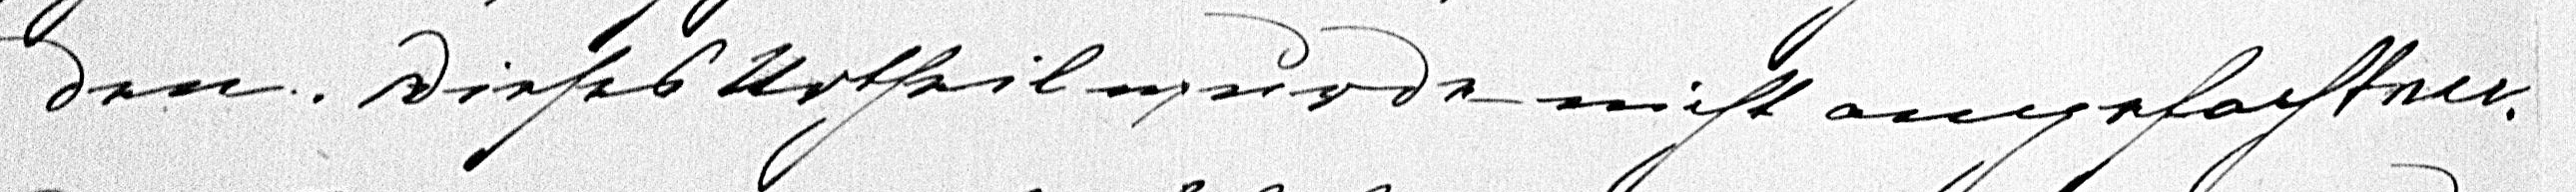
den. Dieses Urtheil wurde nicht angefachten.
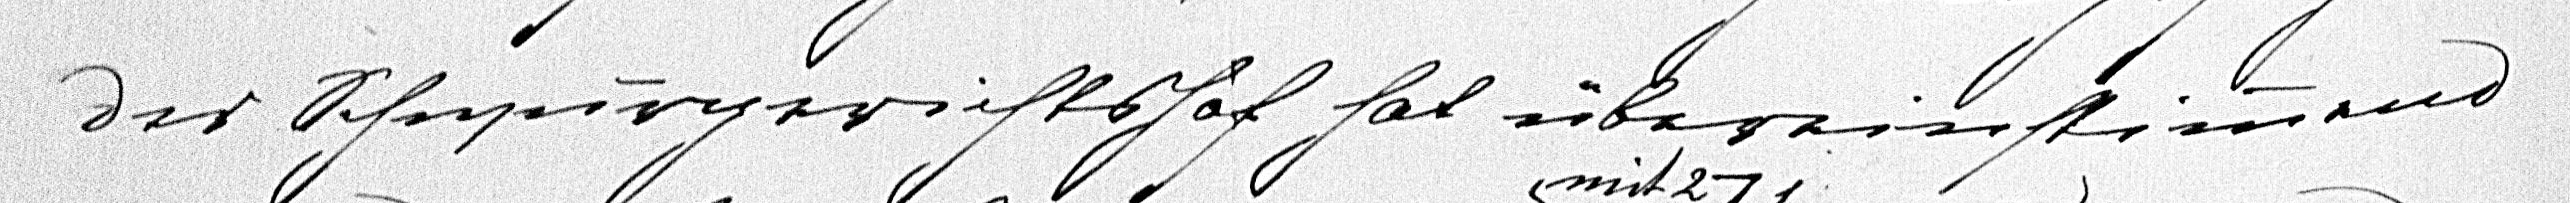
Der Schwurgerichtshof hat übereinstimmend
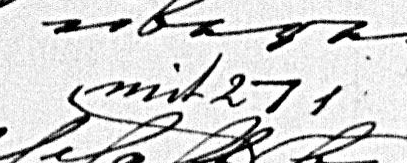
mit 271
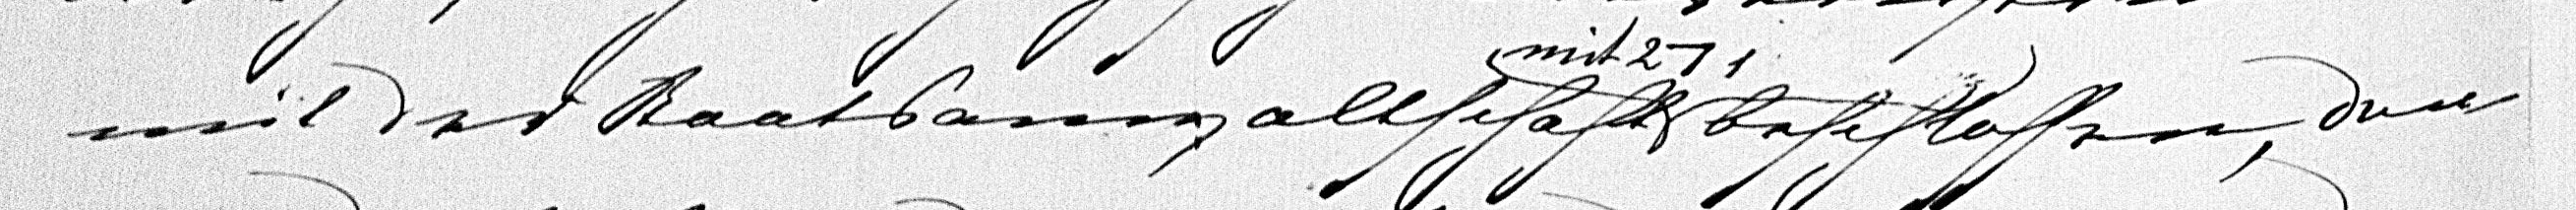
mit der Staatsanwaltschaft beschlossen, den
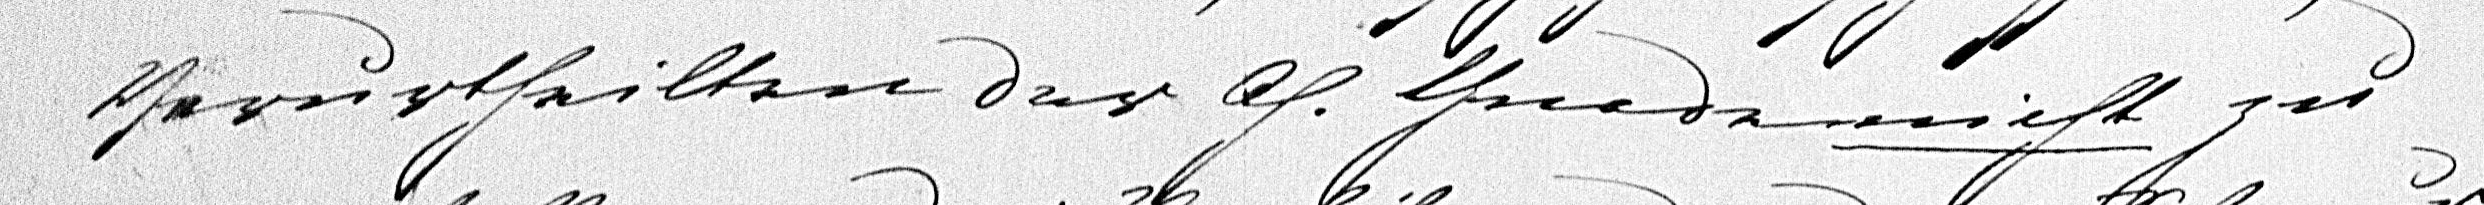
Verurtheilten der Ah. Gnade nicht zu
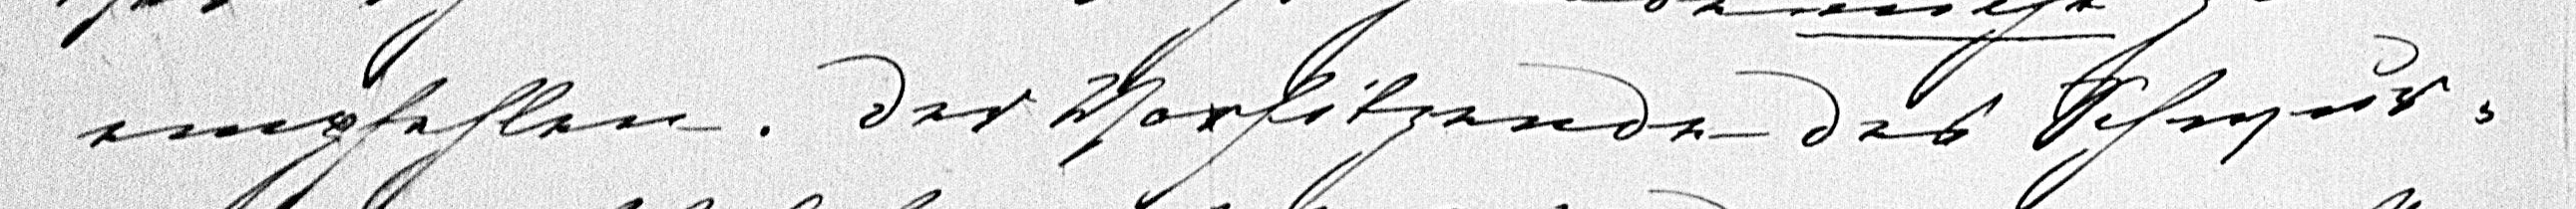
empfehlen. Der Vorfitzende des Schwur¬
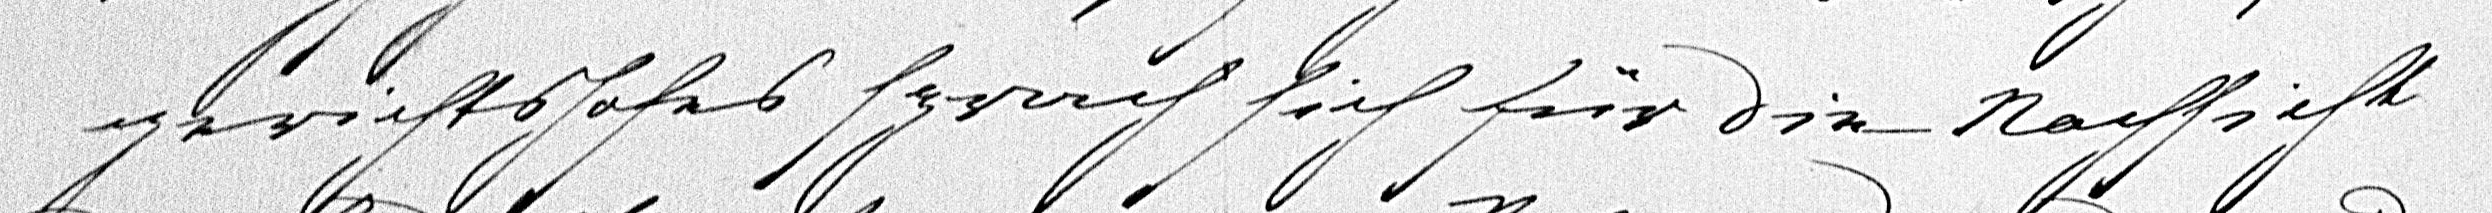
gerichtshofes sprach sich für die Nachsicht
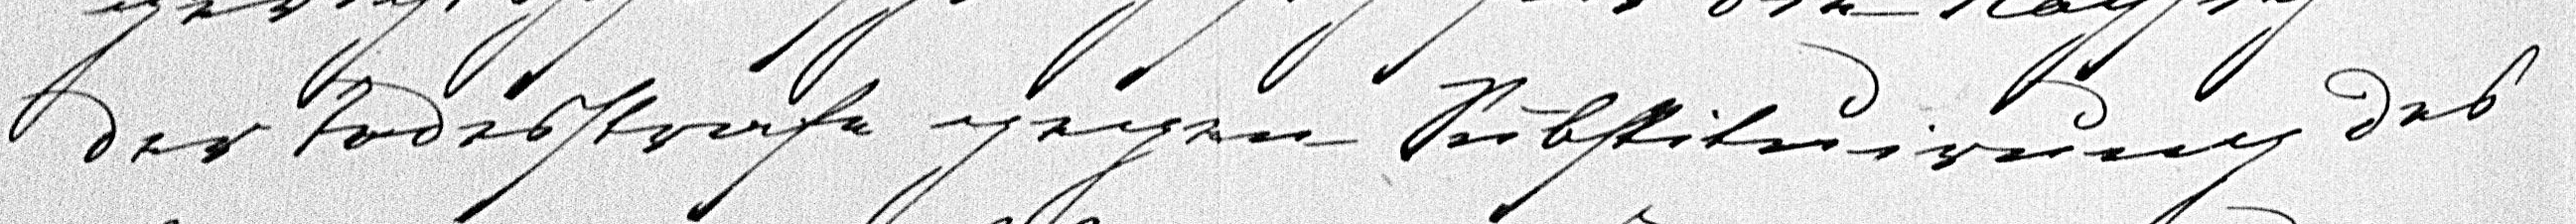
der Todesstrafe gegen Substituirung des
